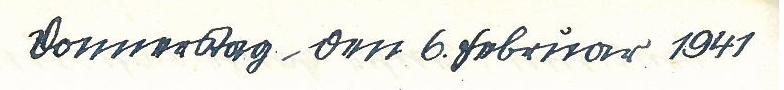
Donnerstag, den 6. Februar 1941
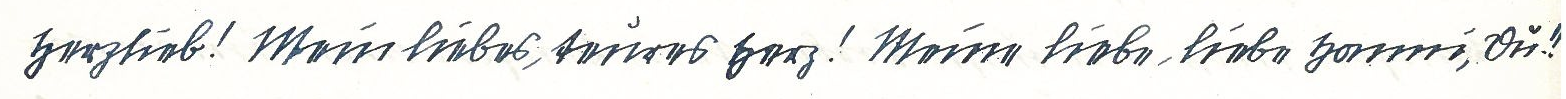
Herzlieb! Mein liebes, teures Herz! Meine liebe, liebe, Du!!
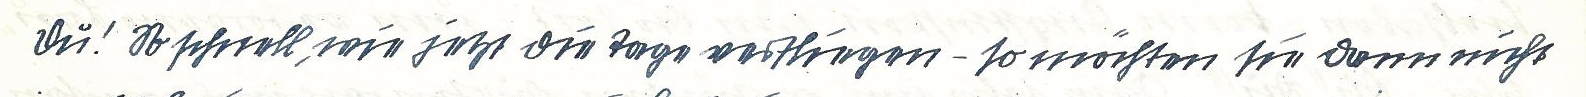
Du! So schnell, wie jetzt die Tage verfliegen – so möchten s`ie dann nicht
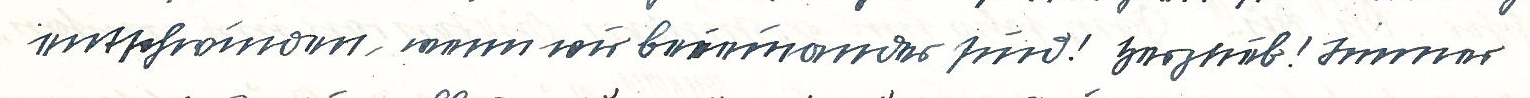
entschwinden, wenn wir beieinander sind! Herzlieb! Immer
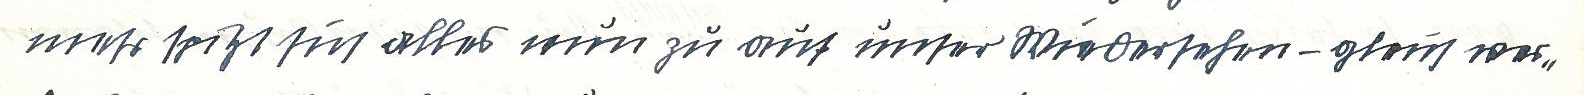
mehr spitzt sich alles nun zu auf unser Wiedersehen – gleich wer¬
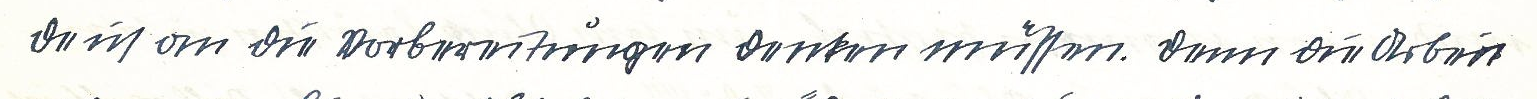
de ich an die Vorbereitungen denken müssen. Denn die Arbeit
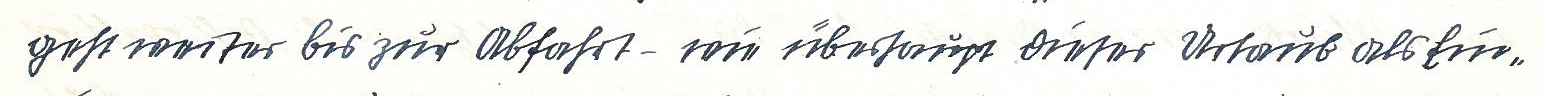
geht weiter bis zur Abfahrt – wie überhaupt dieser Urlaub als Ein¬
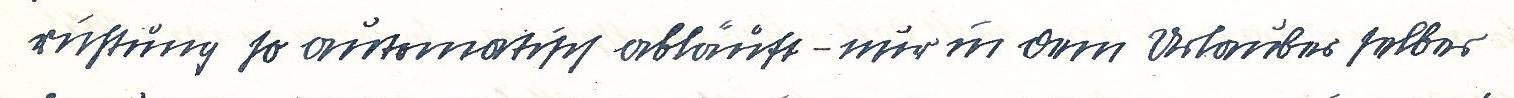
richtung so automatisch abläuft – nur in dem Urlauber selber
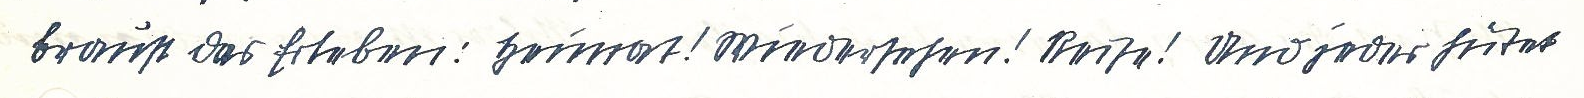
braust das Erleben: Heimat! Wiedersehen! Reise! Und jeder hütet
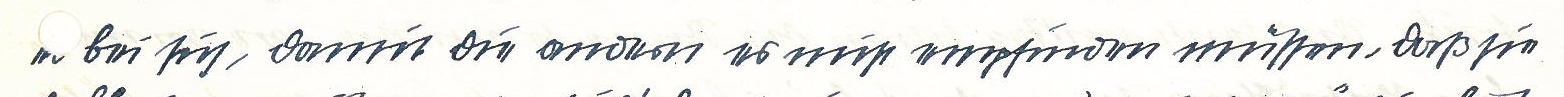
es bei sich, damit die andern es nicht empfinden müssen, daß sie
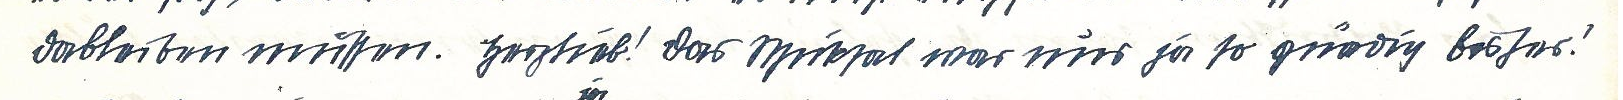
dableiben müssen. Herzlieb! Das Schicksal war uns ja so gnädig bisher!
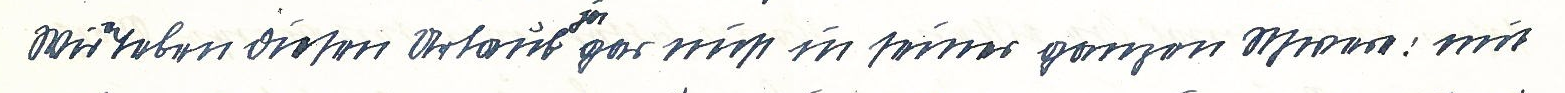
Wir erleben diesen Urlaub ja gar nicht in seiner ganzen Schwere: mit
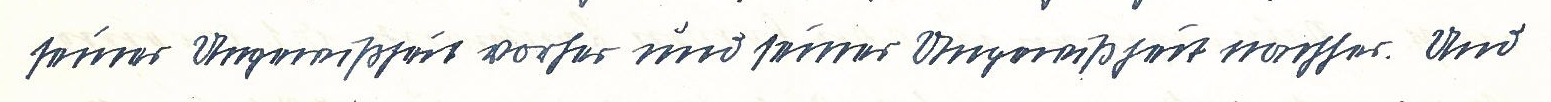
seiner Ungewißheit vorher und seiner Ungewißheit nachher. Und
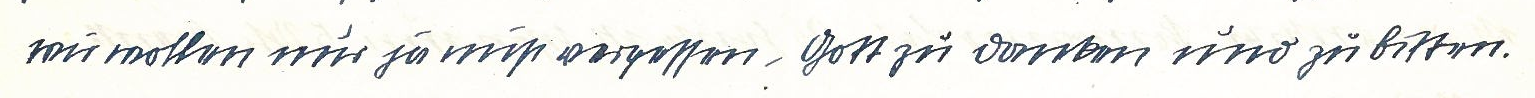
wir wollen nur ja nicht vergessen, Gott zu danken und zu bitten.
